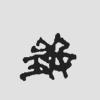襄
